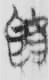既
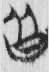皆
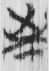至
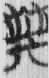典
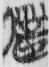○（僕）
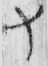又（有）
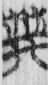典
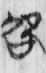卲
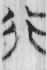行
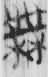無
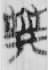典
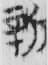新
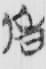俈
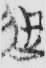○（卜）
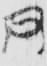尹
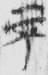不
